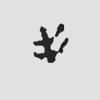丰
